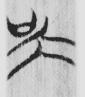吳
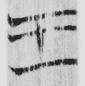王
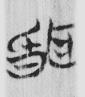䎽
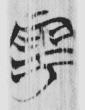𩁹
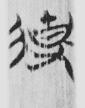𫹒
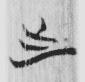之
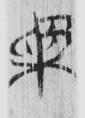柔
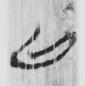㠯（以）
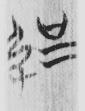{弓口二}
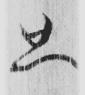也
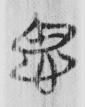思
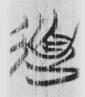道
